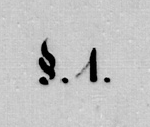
§. 1.
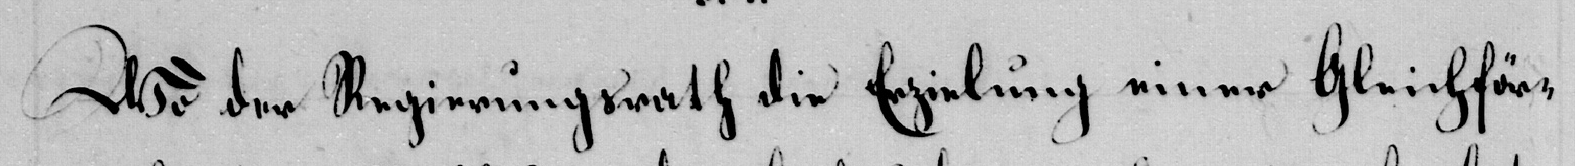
So der Regierungsrath die Erzielung einer Gleichför¬
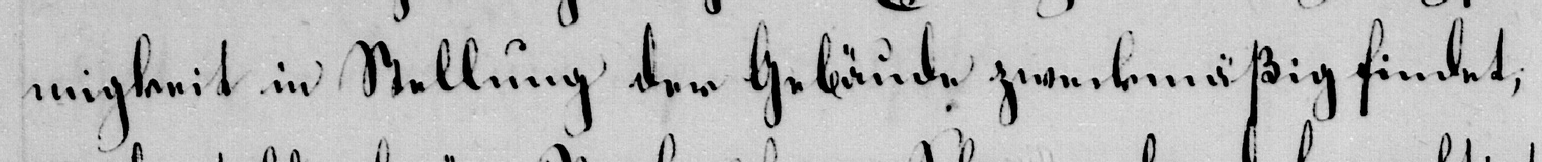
migkeit in Stellung der Gebäude zweckmäßig findet,
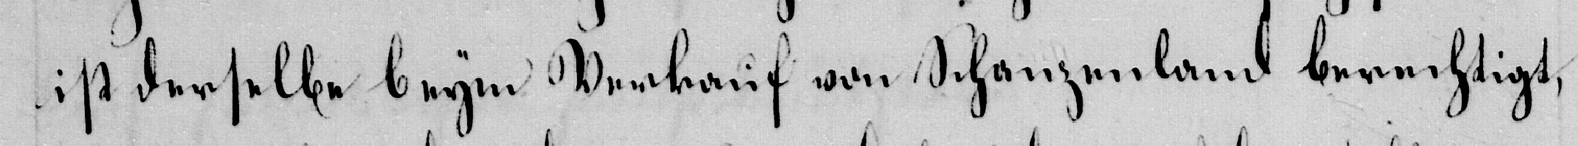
ist derselbe beym Verkauf von Schanzenland berechtigt,
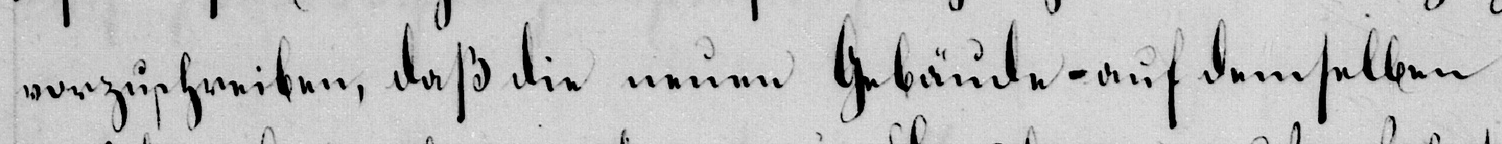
vorzuschreiben, daß die neuen Gebäude auf demselben
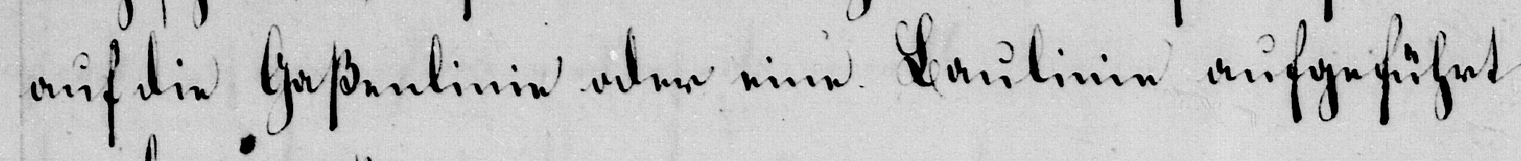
auf die Gaßenlinie oder eine Baulinie aufgeführt
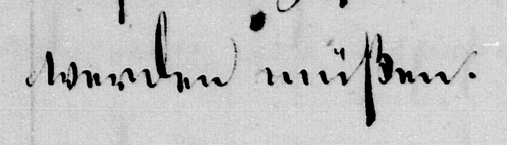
werden müßen.
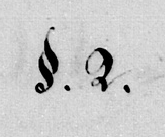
§. 2.
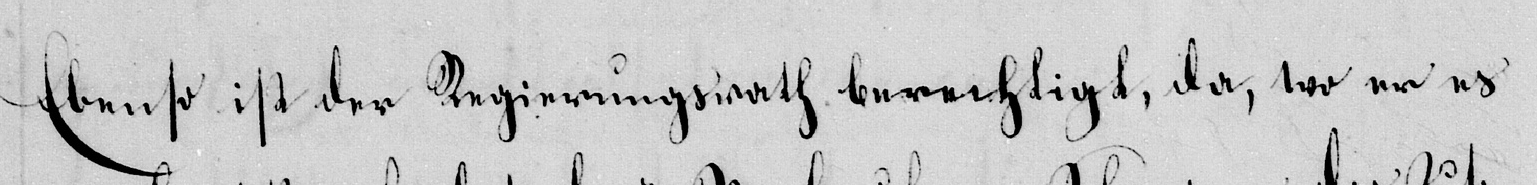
Ebenso ist der Regierungsrath berechtigt, da, wo er es
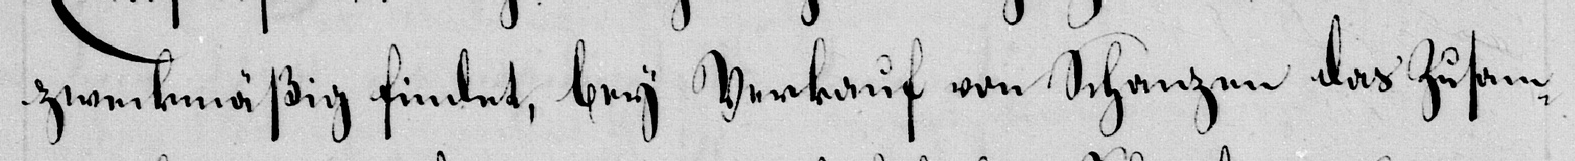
zweckmäßig findet, bey Verkaufe von Schanzen das Zusam¬
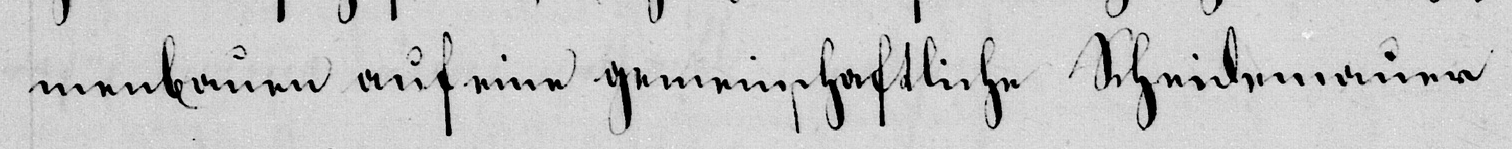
menbauen auf eine gemeinschaftliche Scheidemauer
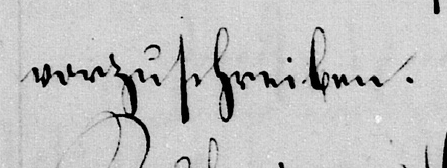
vorzuschreiben.
